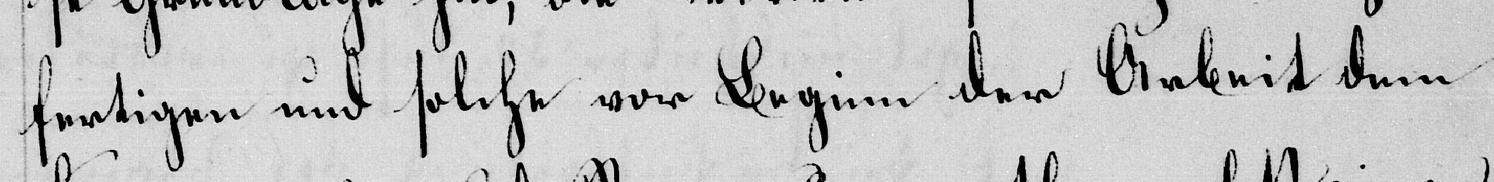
fertigen und solche vor Beginn der Arbeit dem
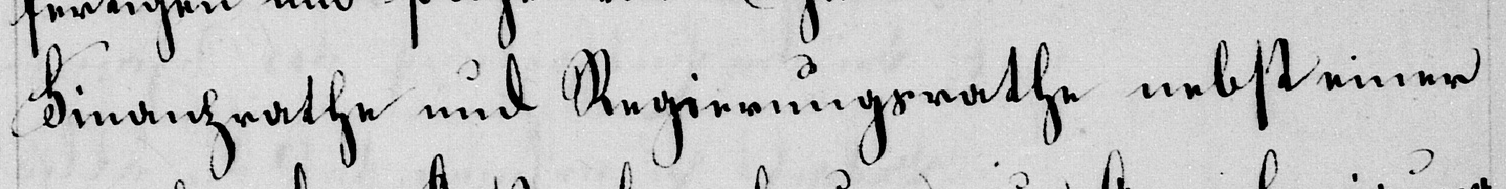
Finanzrathe und Regierungsrathe nebst einer
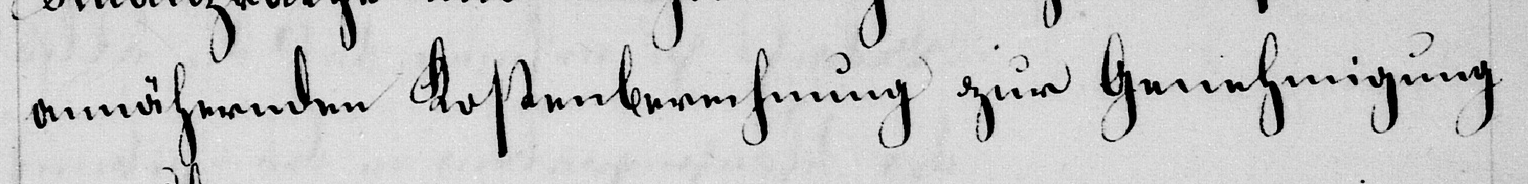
annähernden Kostenberechnung zur Genehmigung
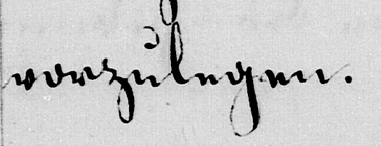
vorzulegen.
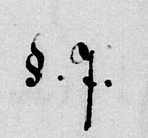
§. 7.
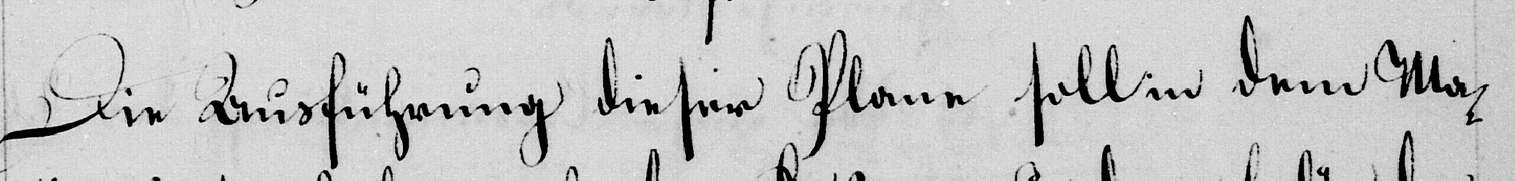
Die Ausführung dieser Plane soll in dem Ma¬
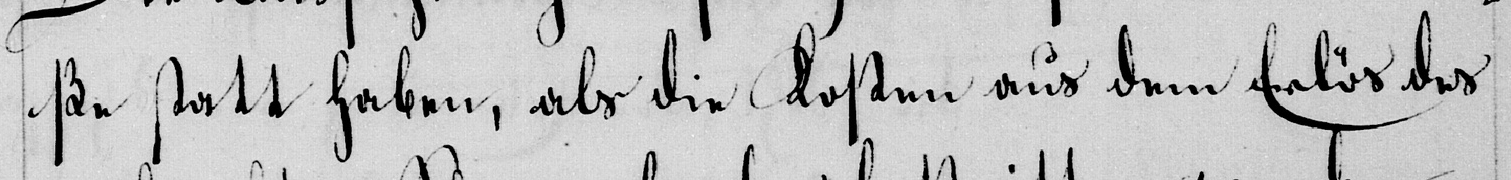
ße statt haben, als die Kosten aus dem Erlös des
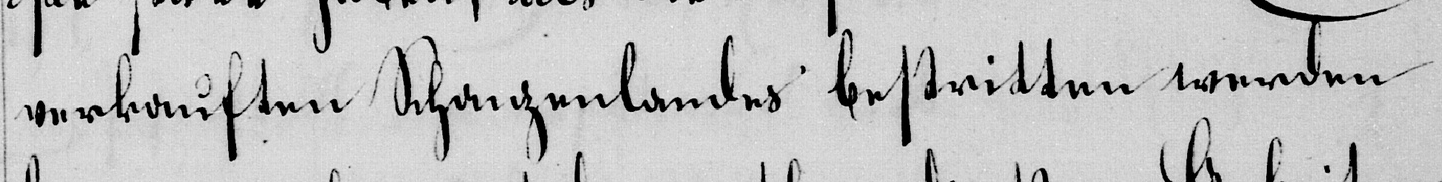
verkauften Schanzenlandes bestritten werden
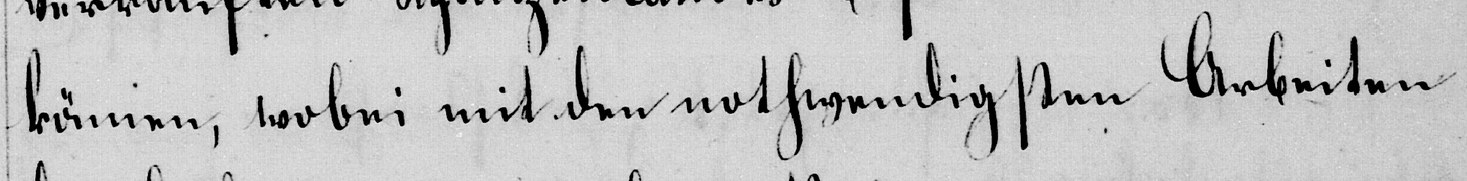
können, wobei mit den nothwendigen Arbeiten
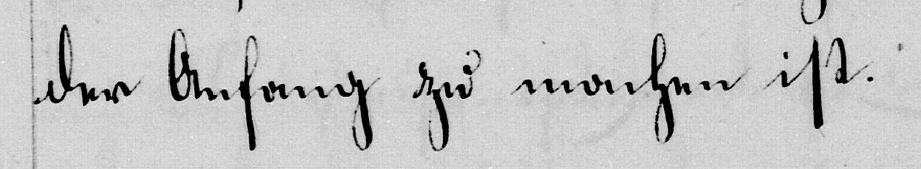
der Anfang zu machen ist.
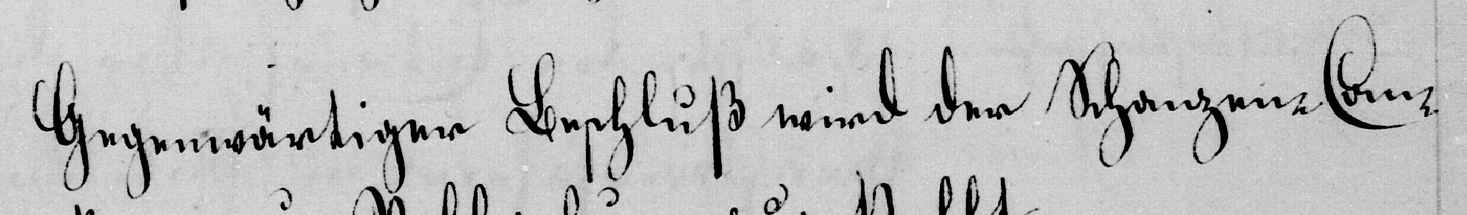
Gegenwärtiger Beschluß wird der Schanzen-Com¬
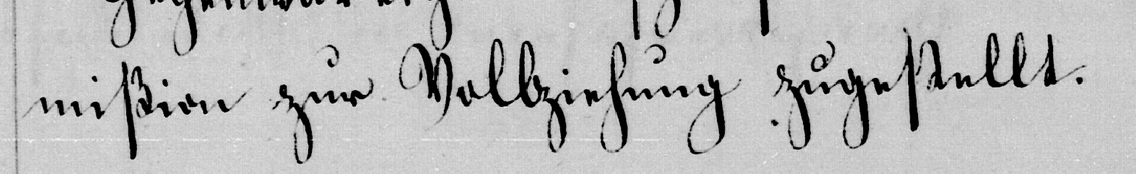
mißion zur Vollziehung zugestellt.
